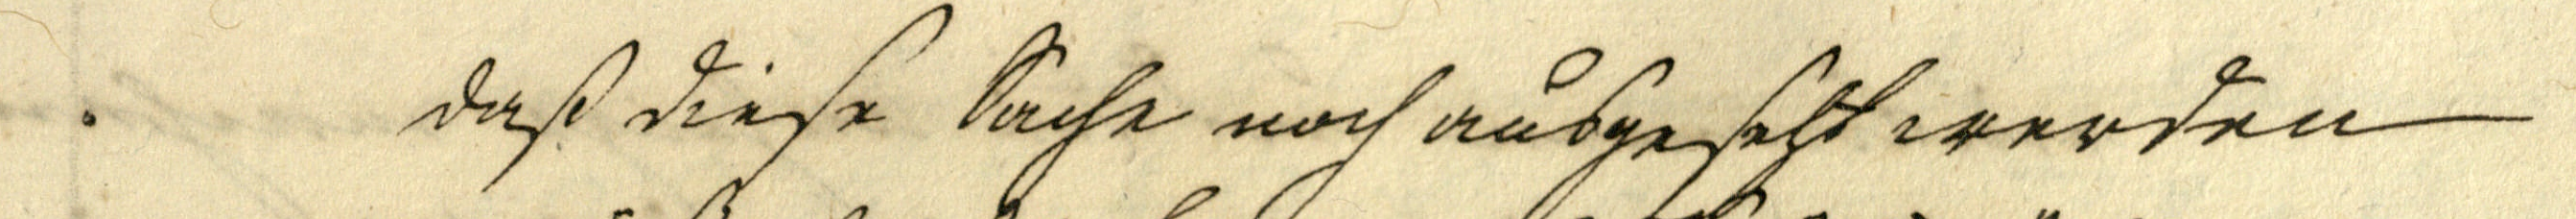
daß diese Sache noch ausgesetzt werden
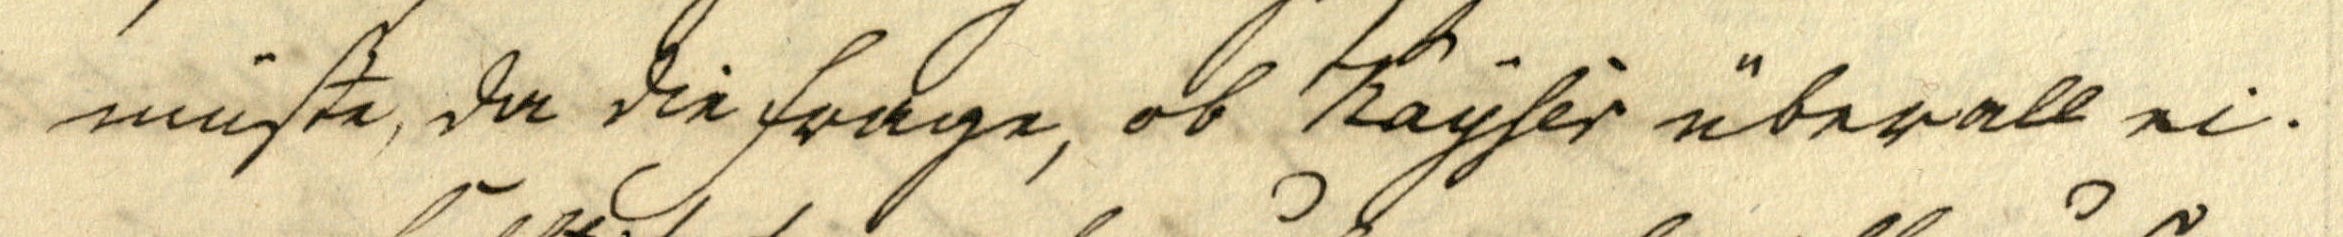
müßte, da die Frage, ob Kayser überall ei-
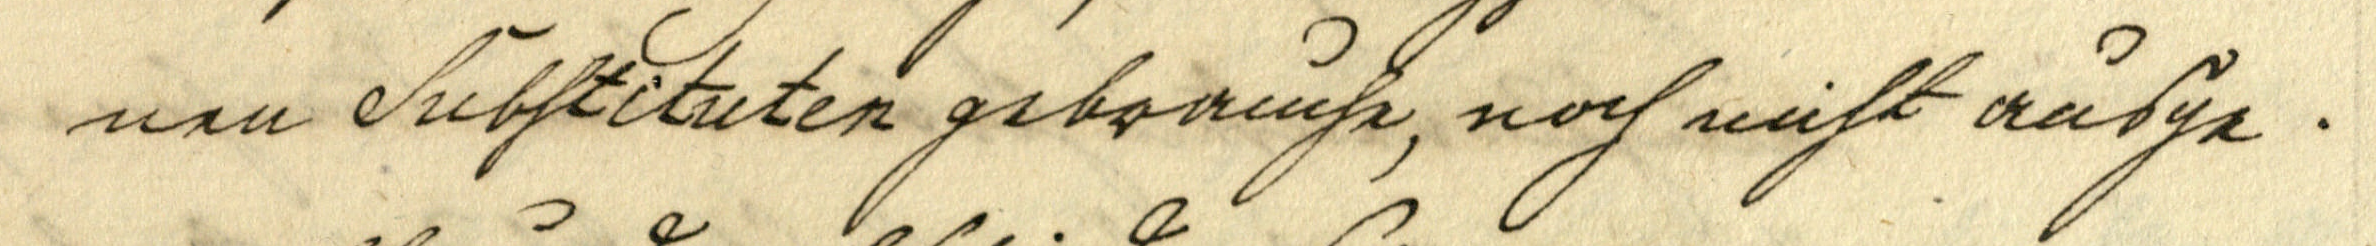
nen Substituten gebrauche, noch nicht ausge-
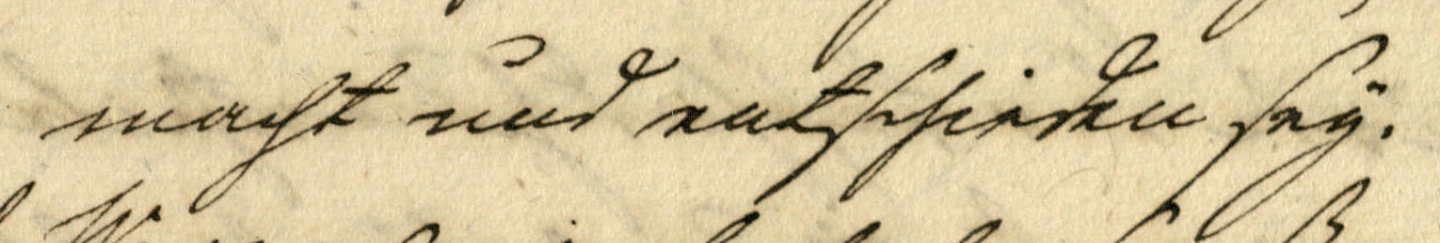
macht und entscheiden sey.
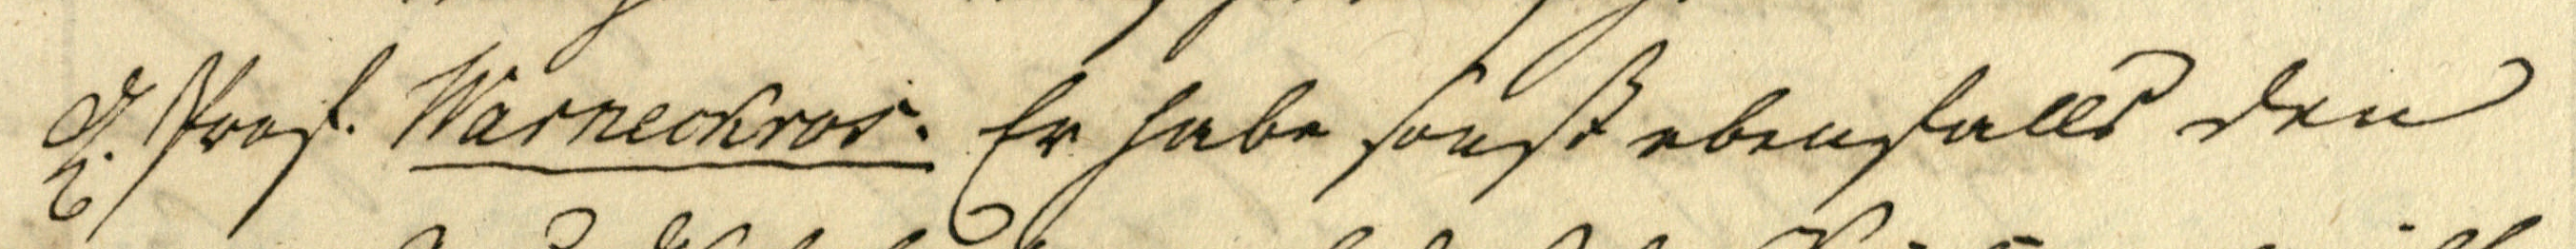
dh. Prof. Warneckros. Er habe sonst ebenfalls den
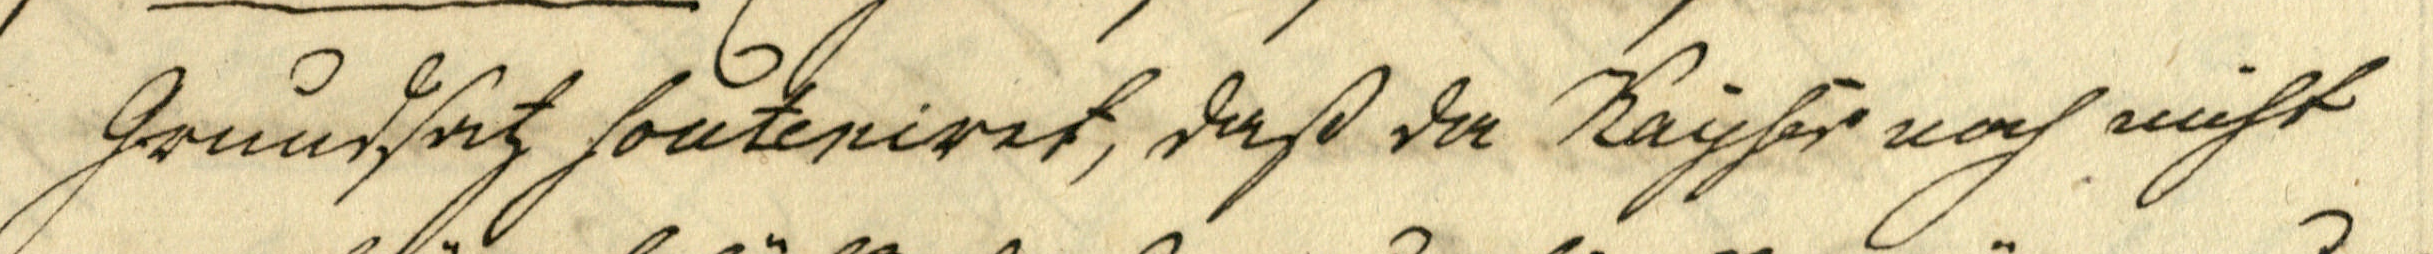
Grundsatz souteniret, daß da Kayser noch nicht
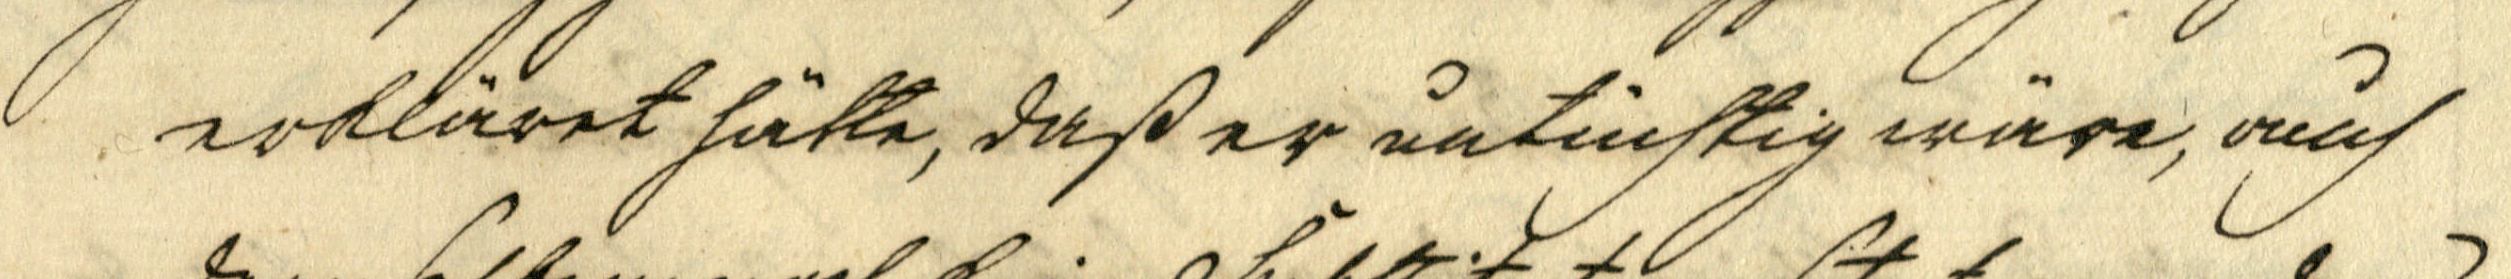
erkläret hätte, daß er untüchtig wäre, auch
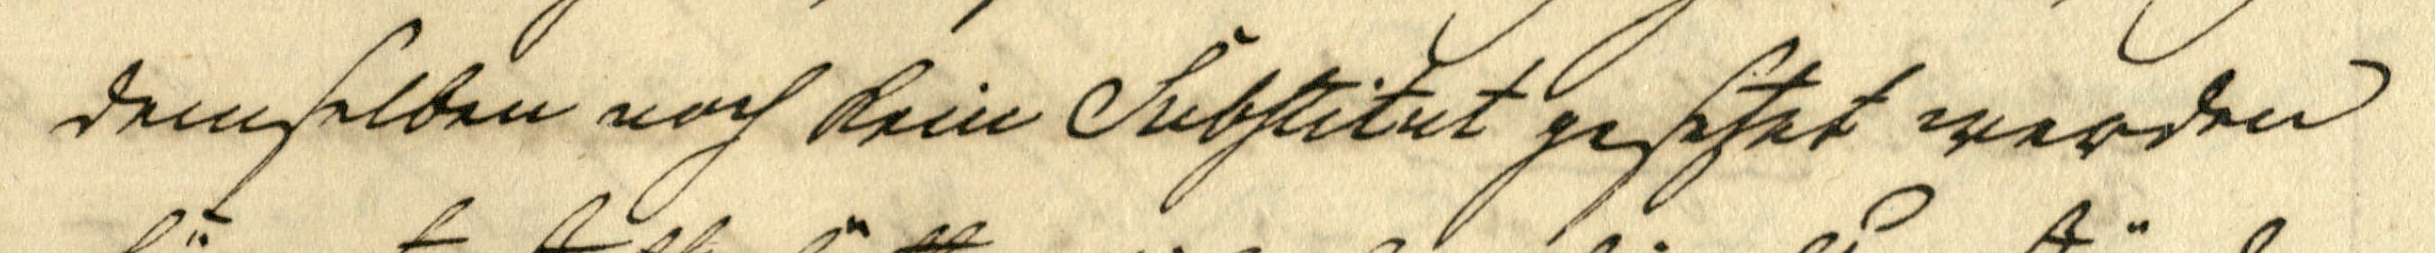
demselben noch kein Substitut gesetzet werden
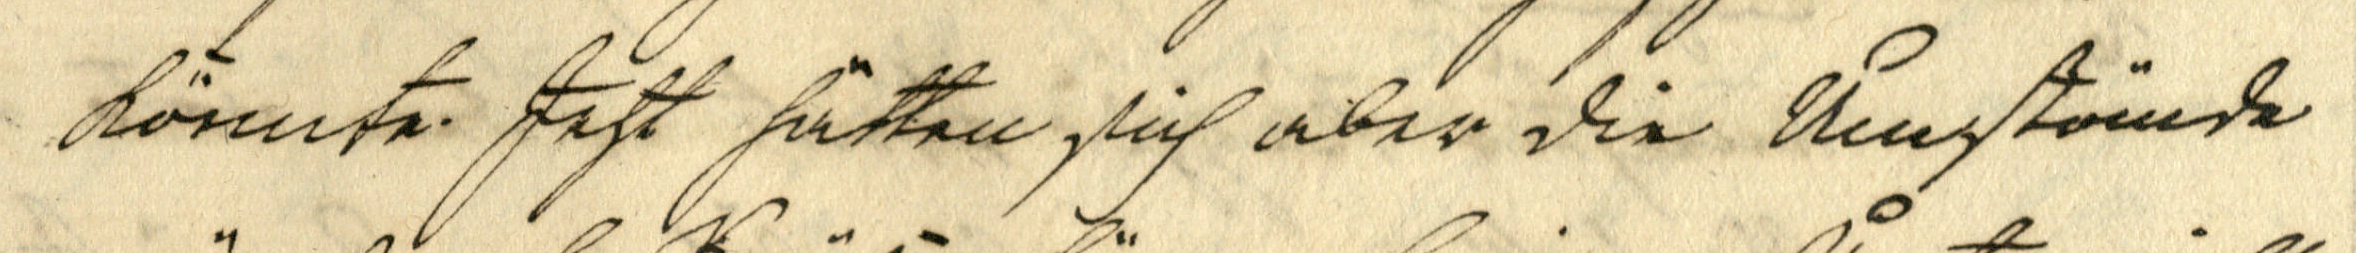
könnte. Jetzt hätten sich aber die Umstände
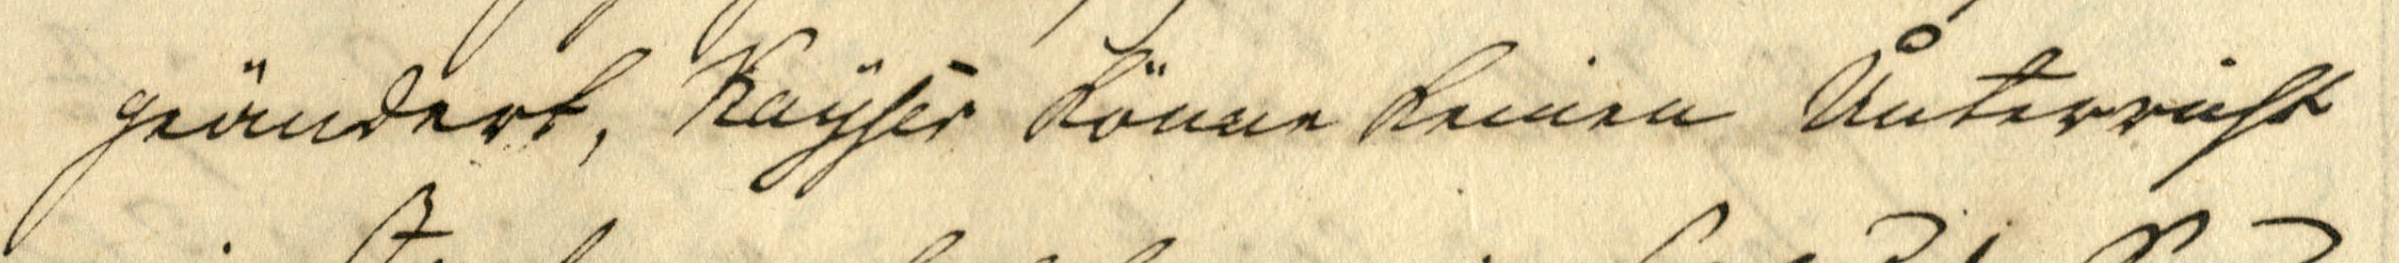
geändert, Kayser könne keinen Unterricht
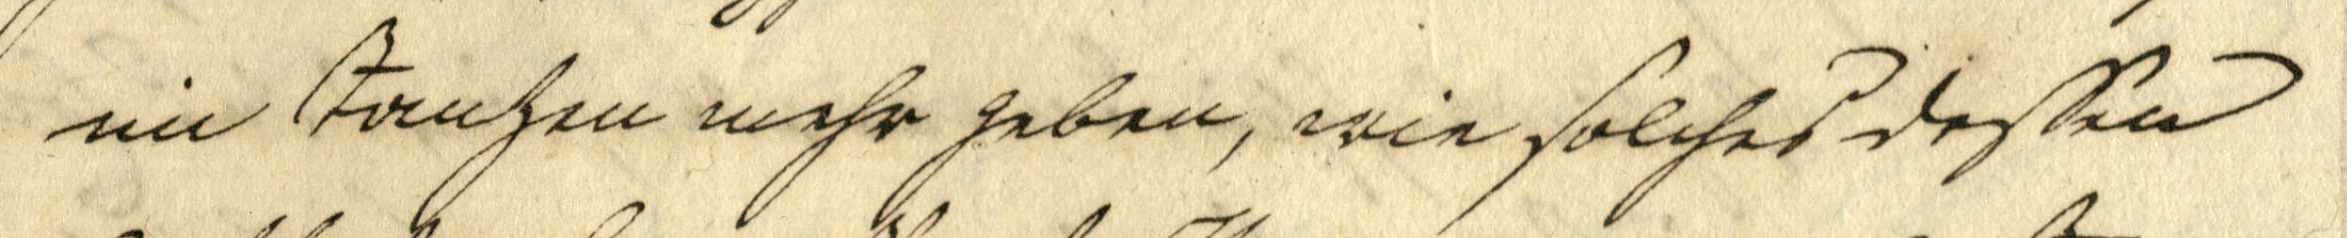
im Tanzen mehr geben, wie solches dessen
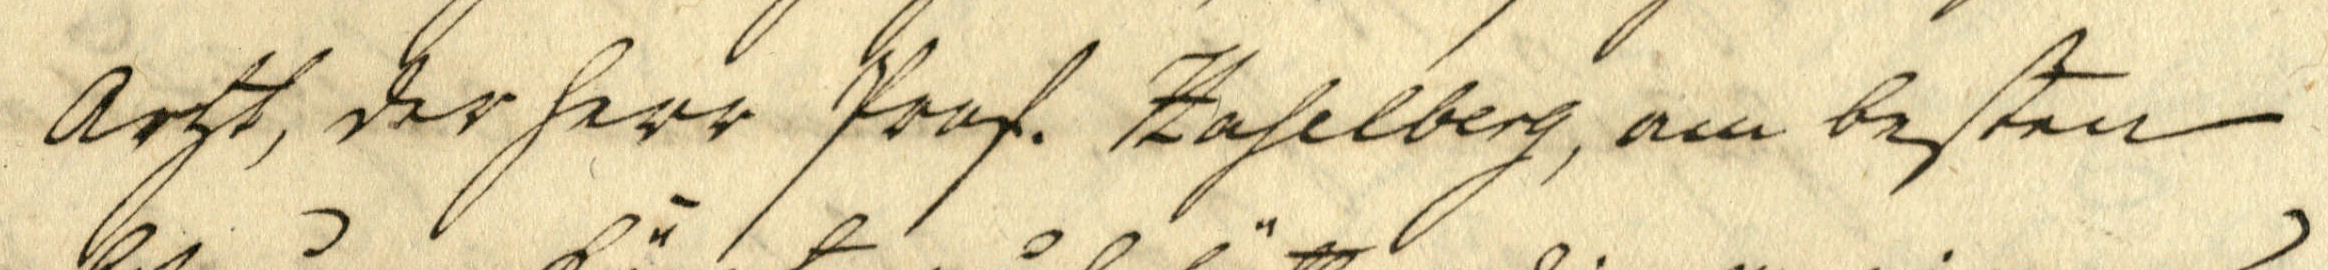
Arzt, der Herr Prof. Haselberg, am besten
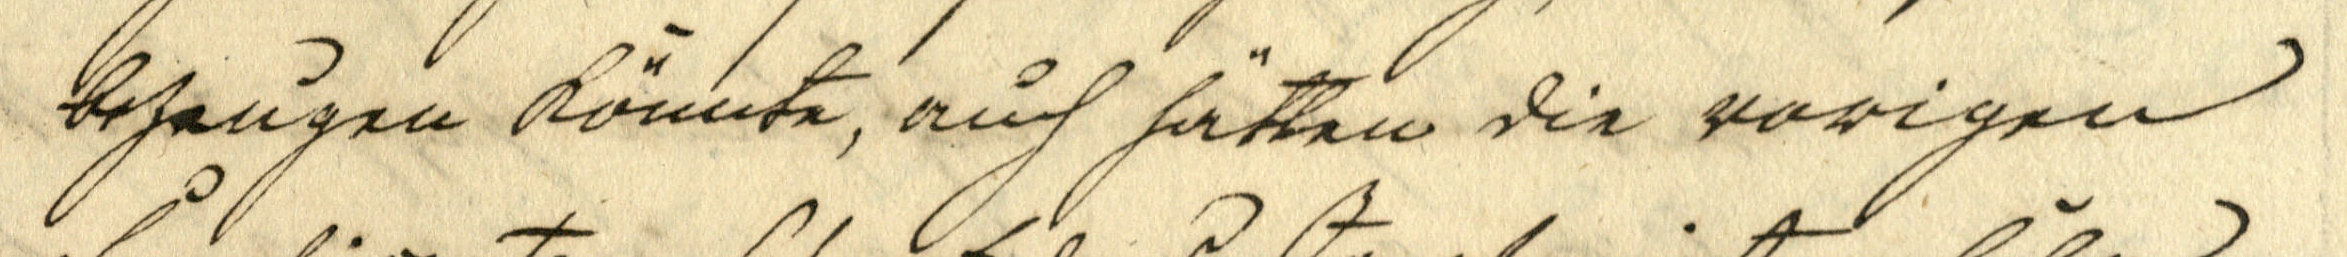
bezeugen könnte, auch hätten die vorigen
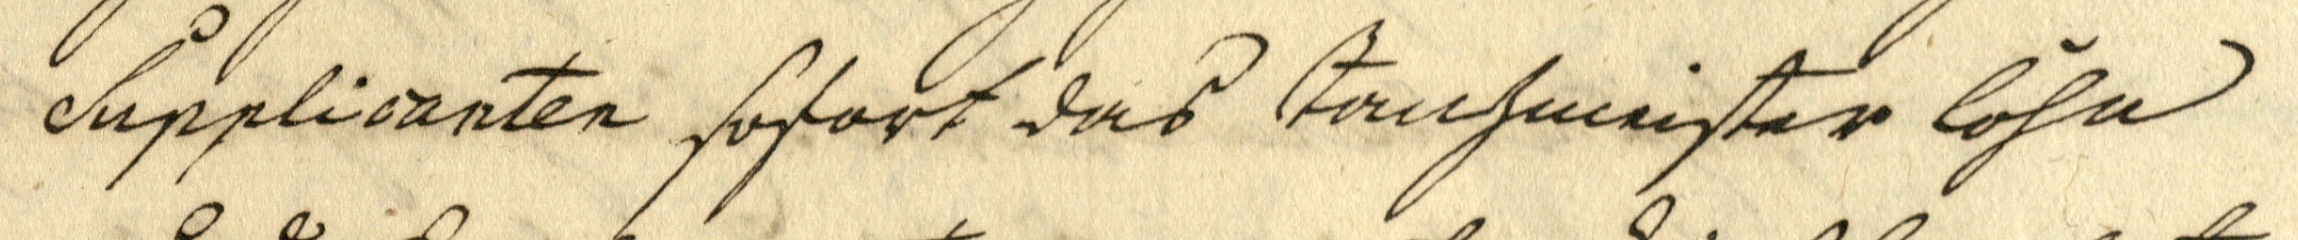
Supplicanten sofort das Tanzmeister Lohn
